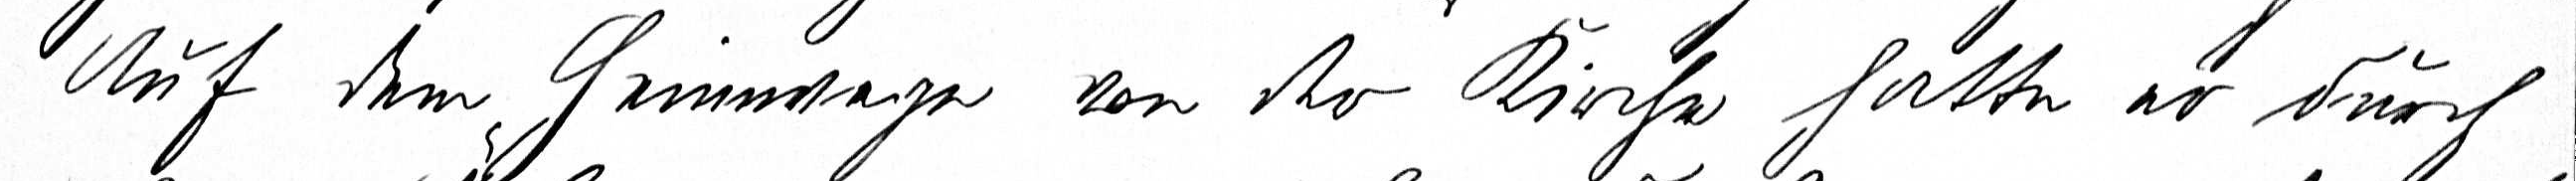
Auf dem Heimwege von der Kirche hatte er durch
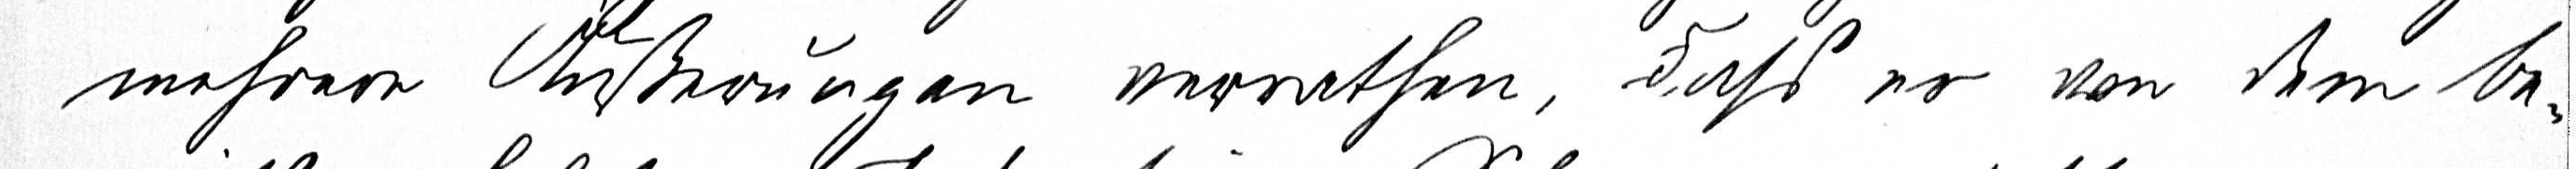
mehrere Äußerungen verrathen, daß es von dem be¬
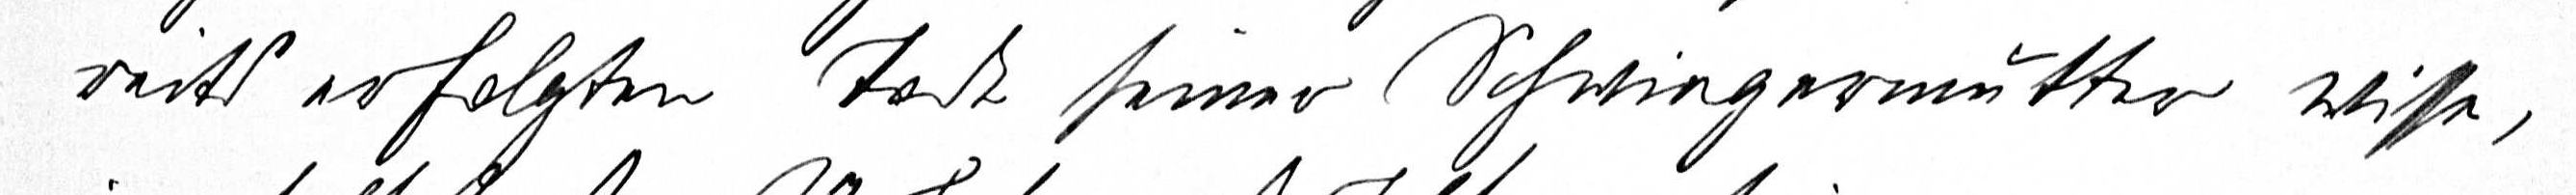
reits erfolgten Tode seiner Schwiegermutter wisse,
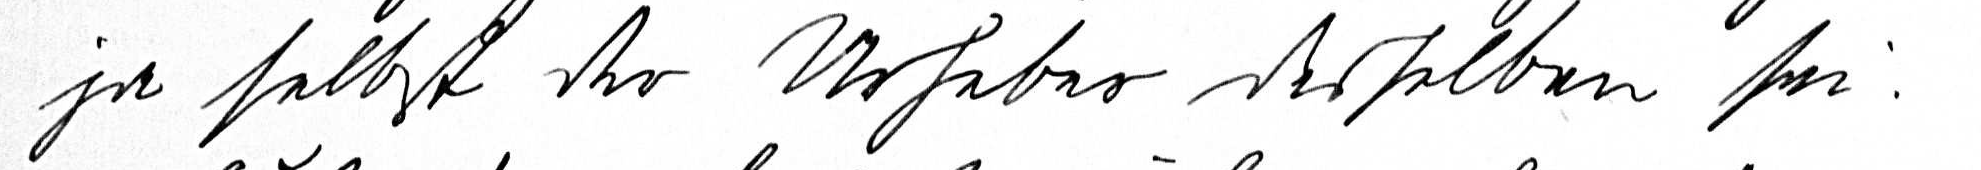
ja selbst der Urheber desselben sei:
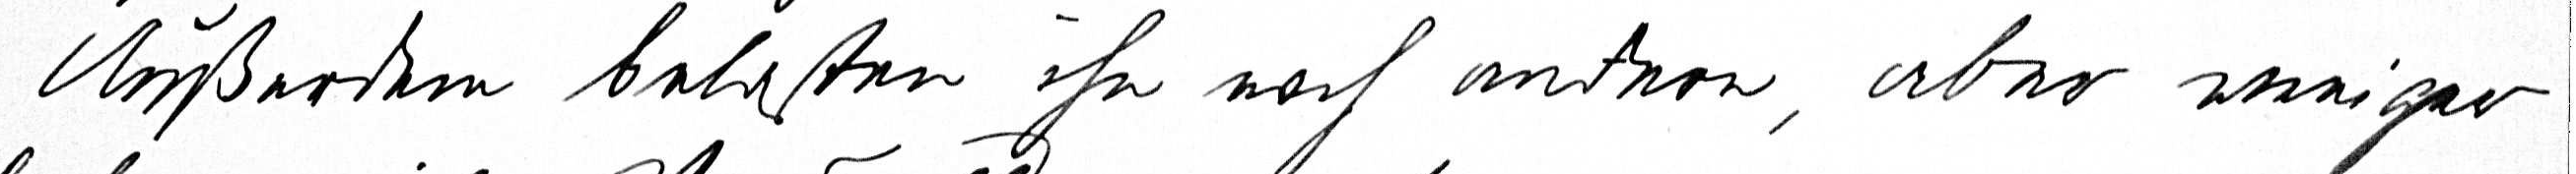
Außerdem belasten ihn noch andere, aber weniger
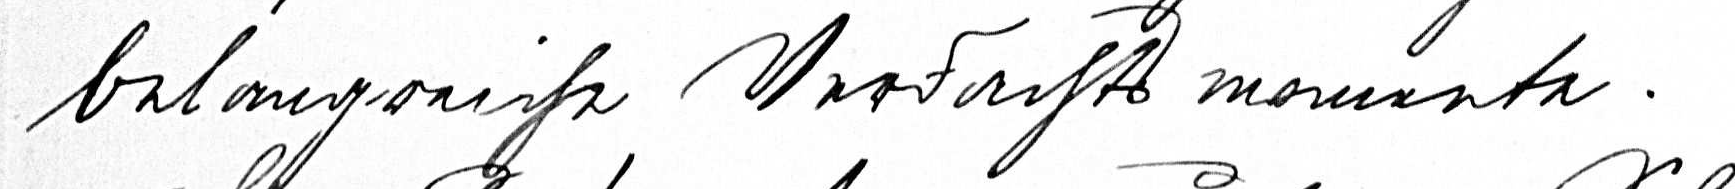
belangsreiche Verdachtsmomente.
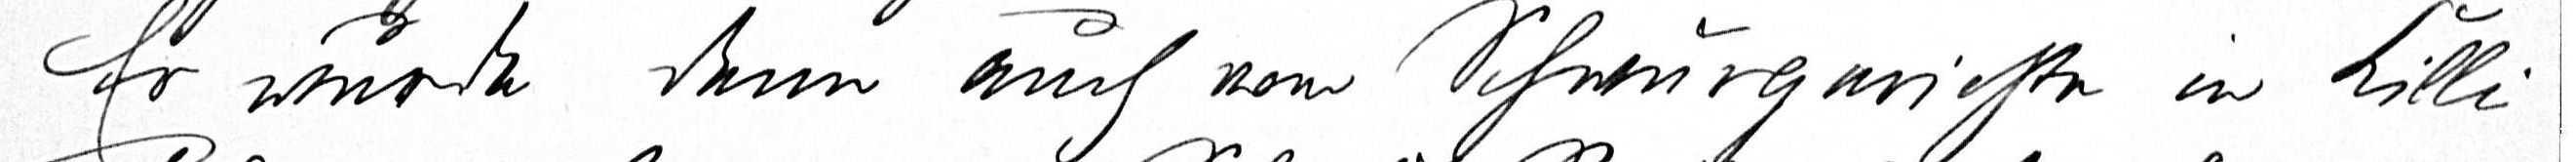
Er wurde denn auch vom Schwurgerichte in Čilli
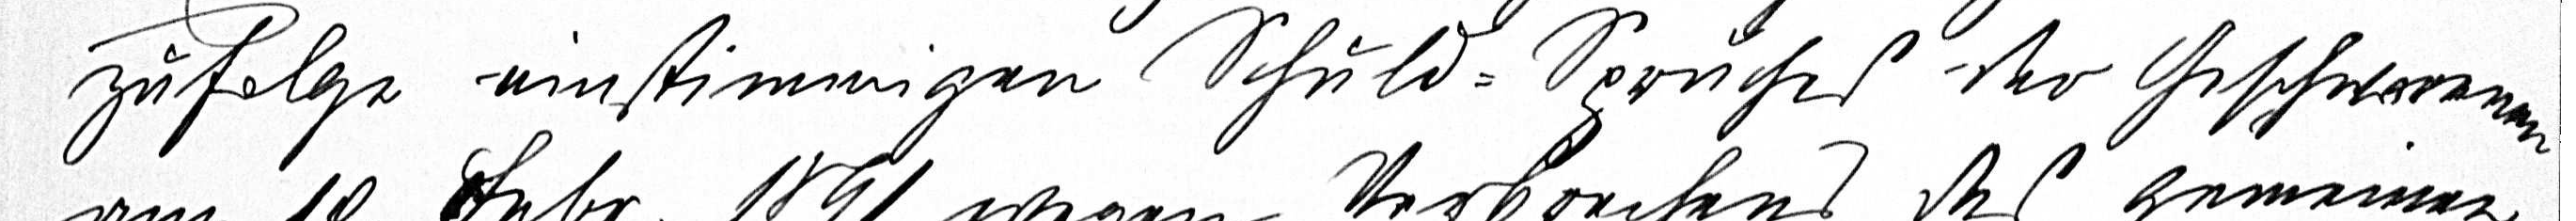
zufolge einstimmigen Schuld-Spruches der Geschworenen
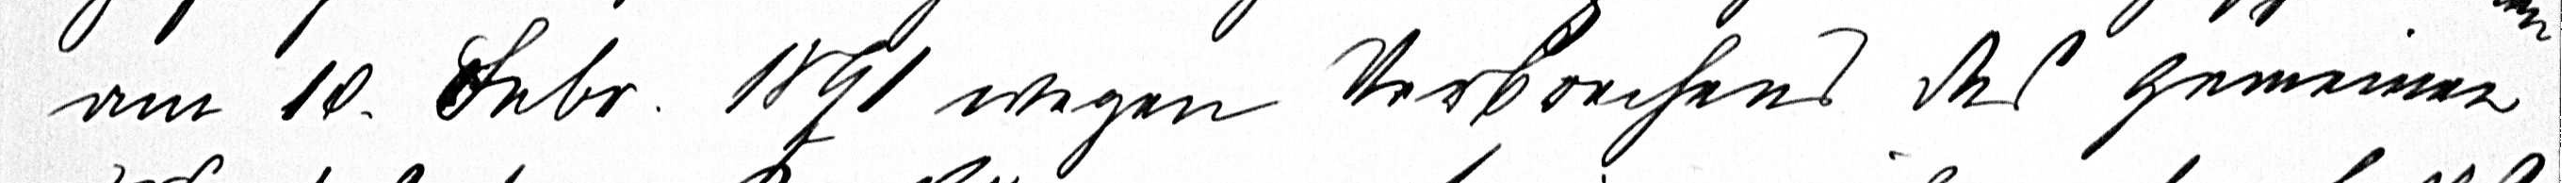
am 10. Febr. 1891 wegen Verbrechens des gemeinen
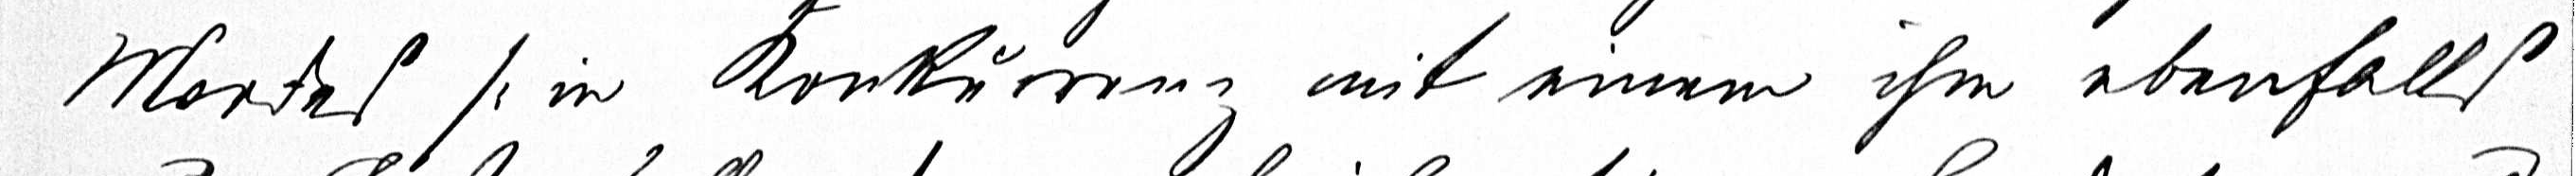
Mordes (in Konkurrenz mit einem ihn ebenfalls
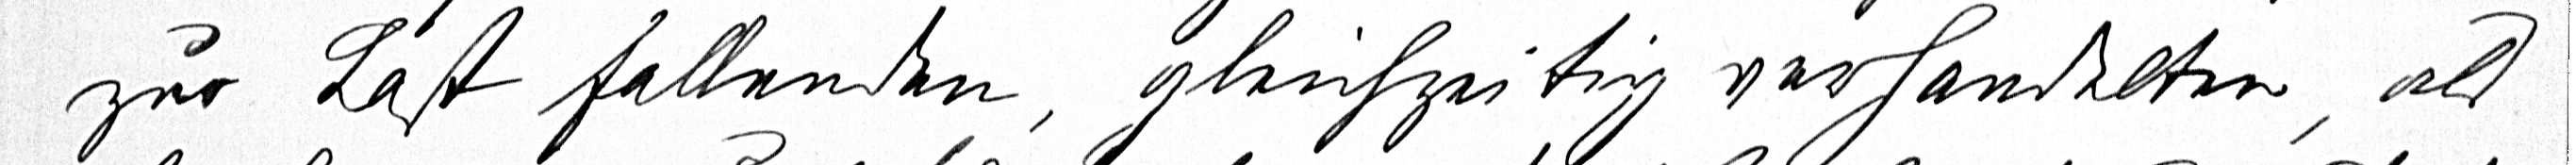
zur Last fallenden, gleichzeitig verhandelten, als
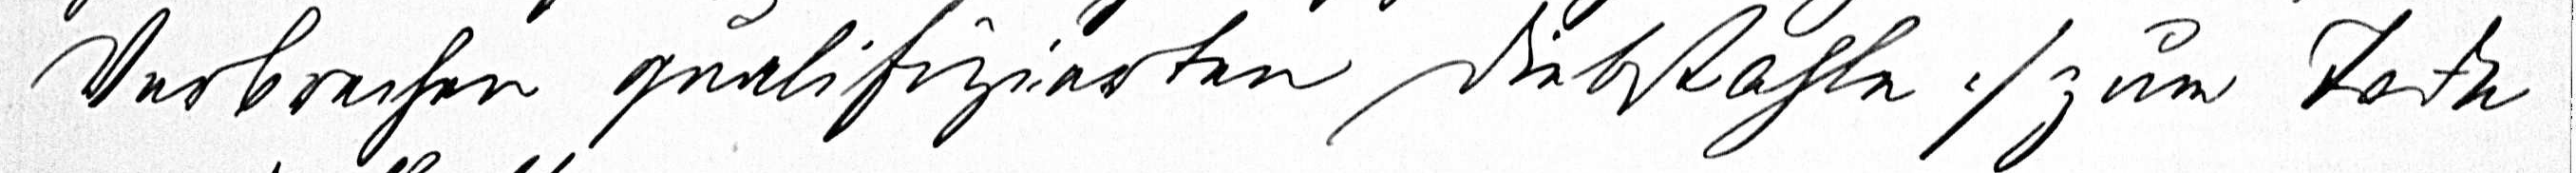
Verbrechen qualifizierten Diebstahle) zum Tode
